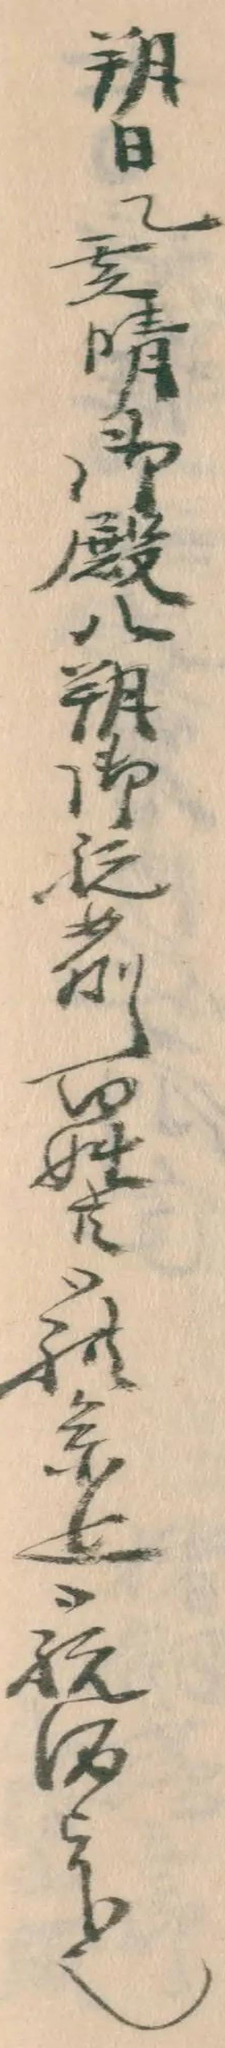朔日乙亥晴御殿八朔御祝如例百姓共御礼参上御祝酒被下也
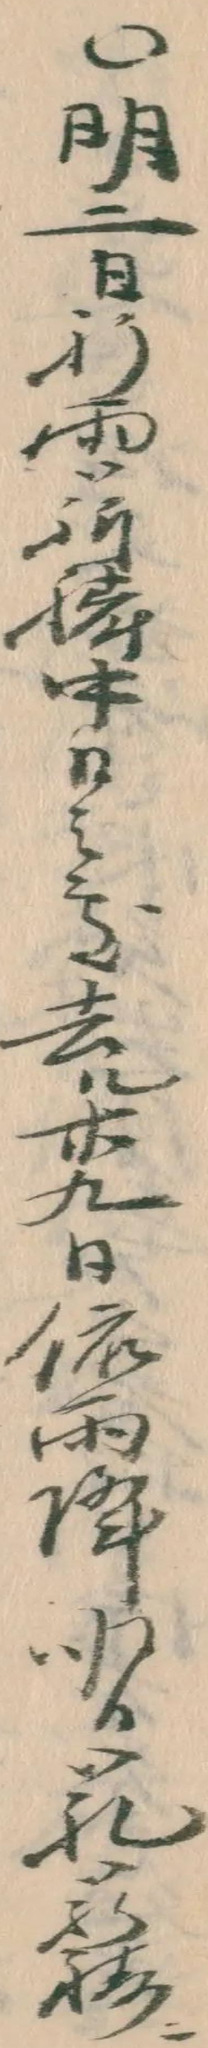○明二日祈雨御祈祷中日之處去ル廿九日依雨降明日御礼御祈禱ニ
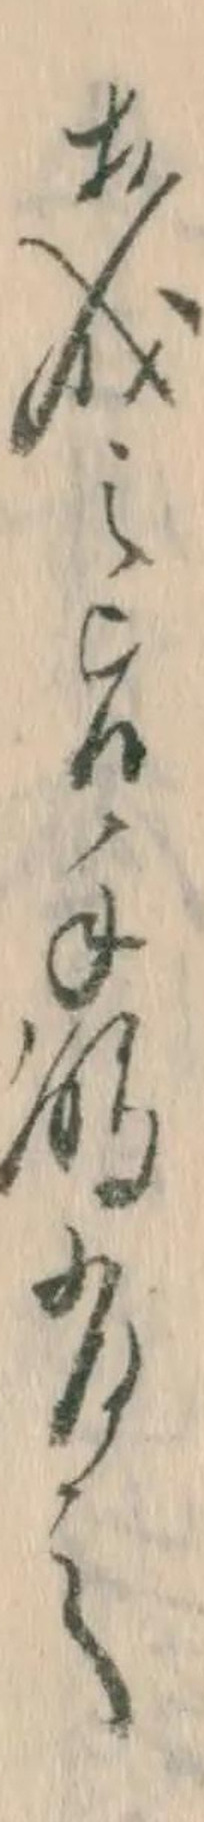相成之旨手觸有之
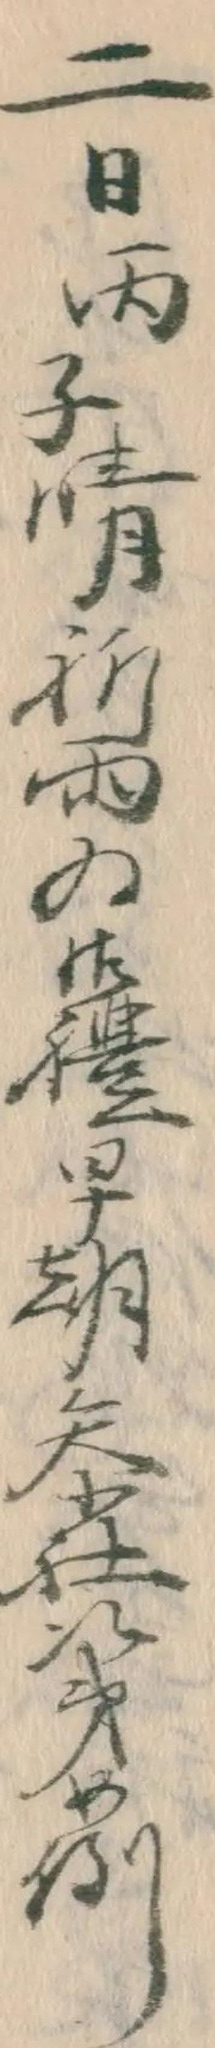二日丙子晴祈雨為御礼早朝参社次第如例
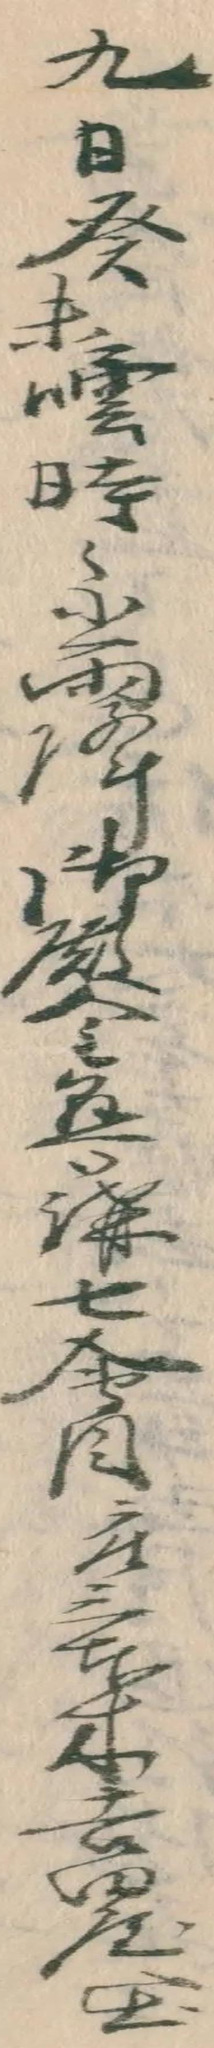九日癸未曇時々小雨降御殿金懸御講七會目ニ付三本木吉田屋へ出
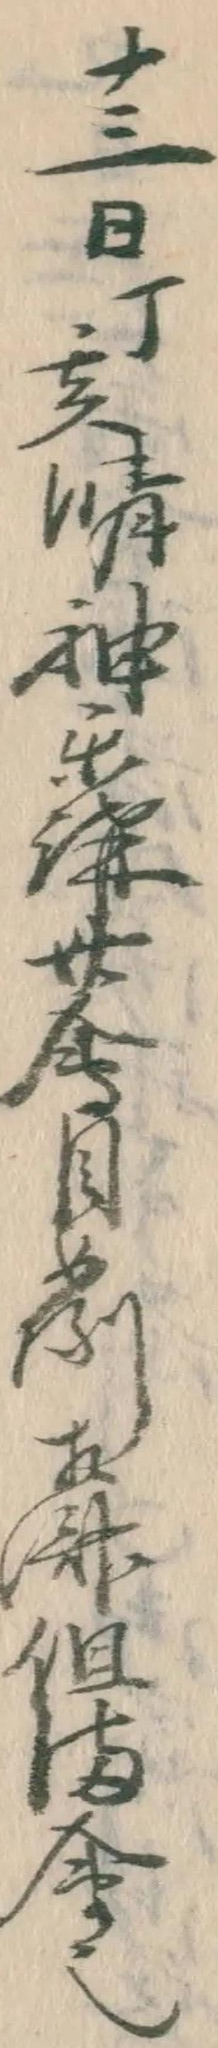十三日丁亥晴神楽講廿會目如例相済但満會也
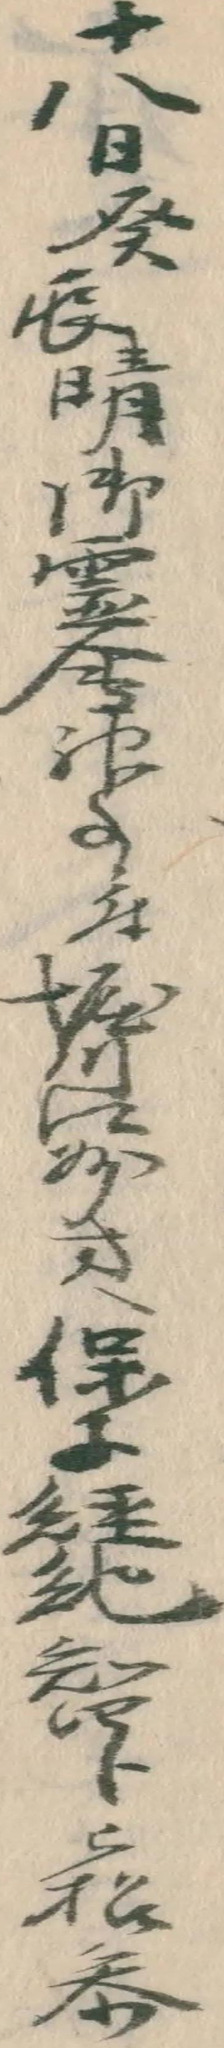十八日癸辰晴御霊會神事ニ付堀川郷助方へ保子経紀知四郎被招参
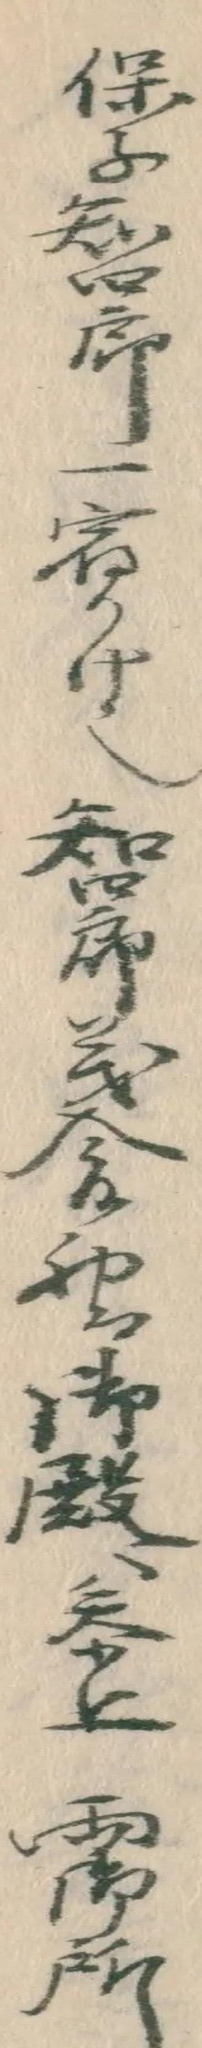保子知四郎一宿かけ也知五郎義今日初而御殿へ参上両御所
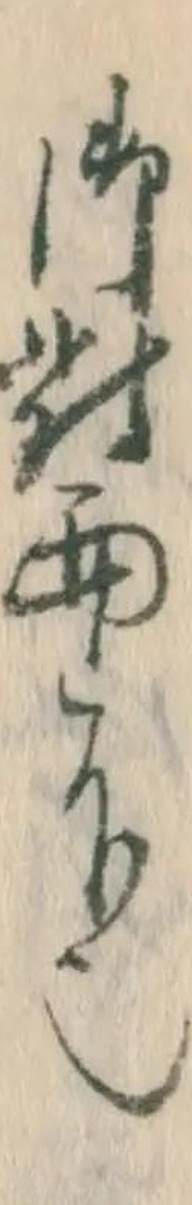御對面被下也
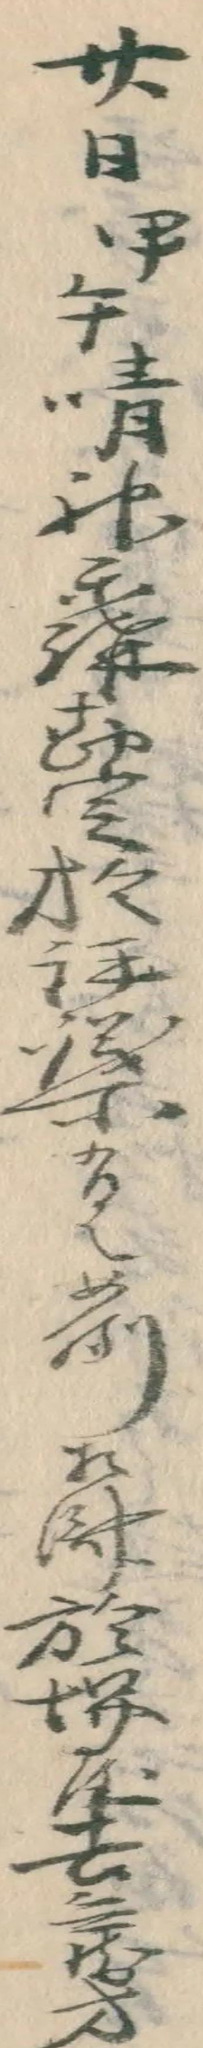廿日甲午晴神楽講勘定於評議等有之如例相済於堺屋去兵衛方
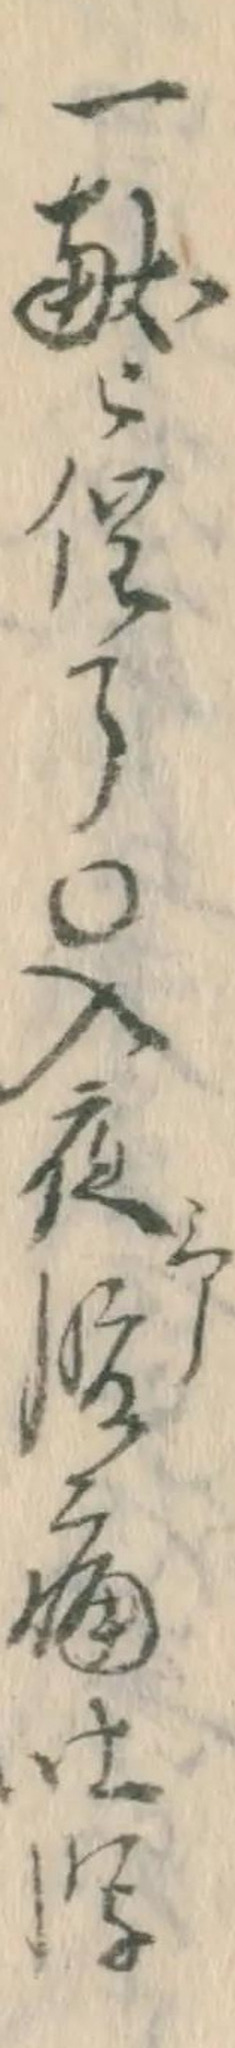一献被催了○入夜予腹痛吐瀉
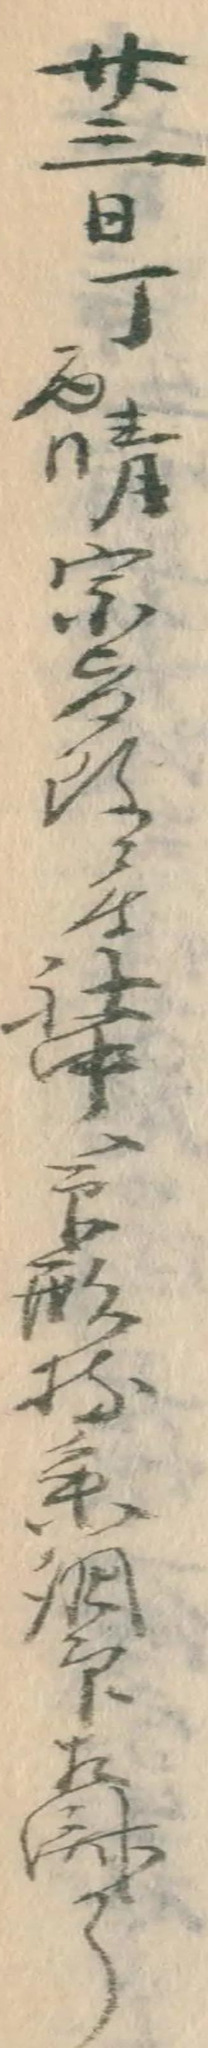廿三日丁酉晴宗貞改ニ付社中へ印形持参調印相済了

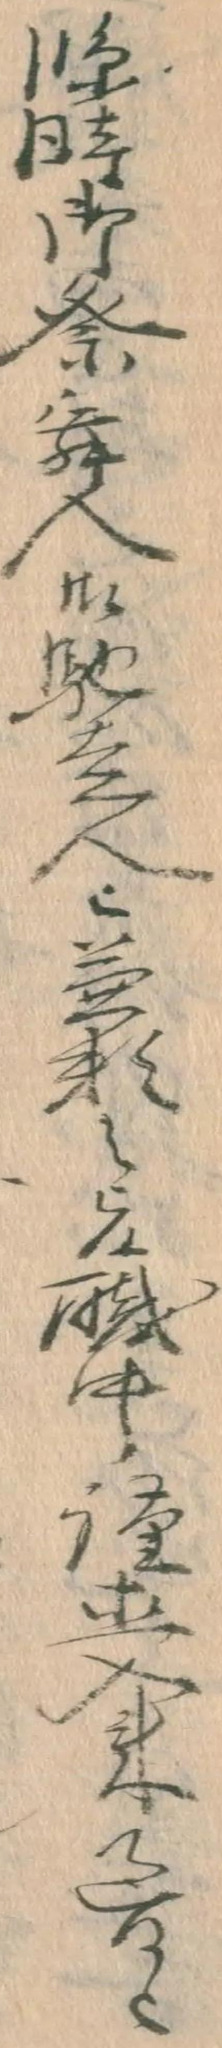臨時御祭舞人御馳走人え兼頼之旨職中ノ謹直入来過日被
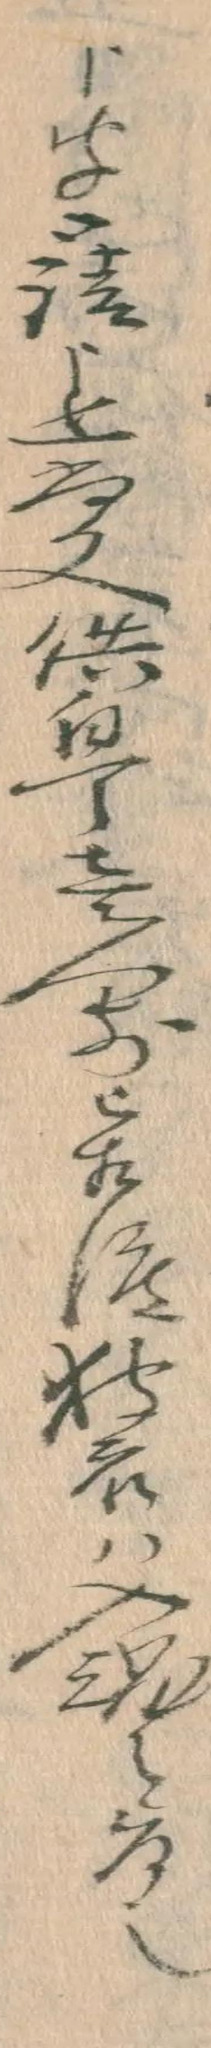申聞御請申上尚又供白丁壱人前被相渡狩衣ハ入魂之旨也
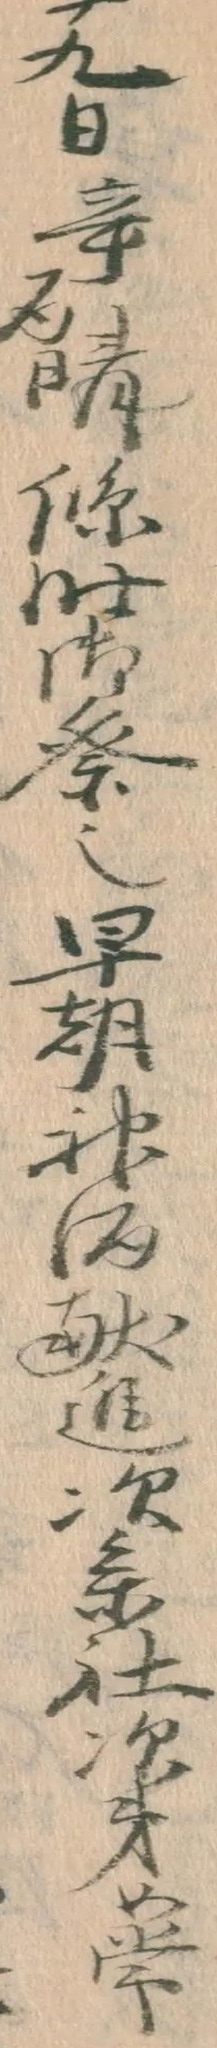十九日辛酉晴臨時御祭也早朝神酒献進次参社次第如常
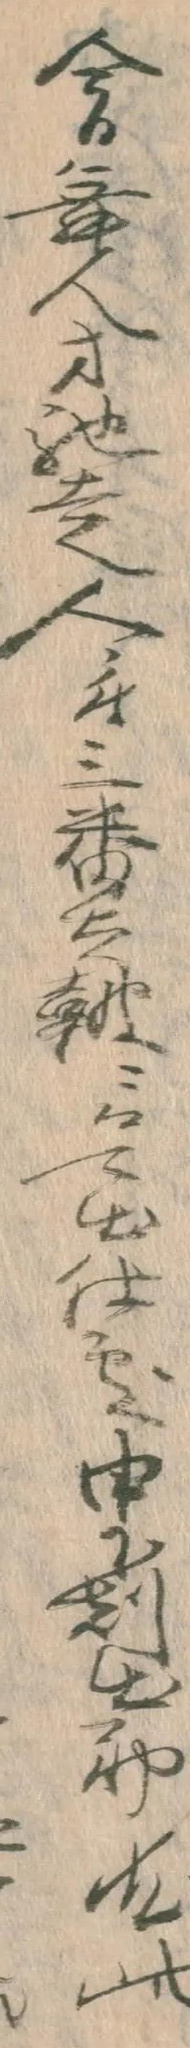今日舞人方馳走人ニ付三番太皷ニ而可出仕處申下刻出勤尤此
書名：賀茂社記録. 第66冊
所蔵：国立国会図書館 National Diet Library, JAPAN
